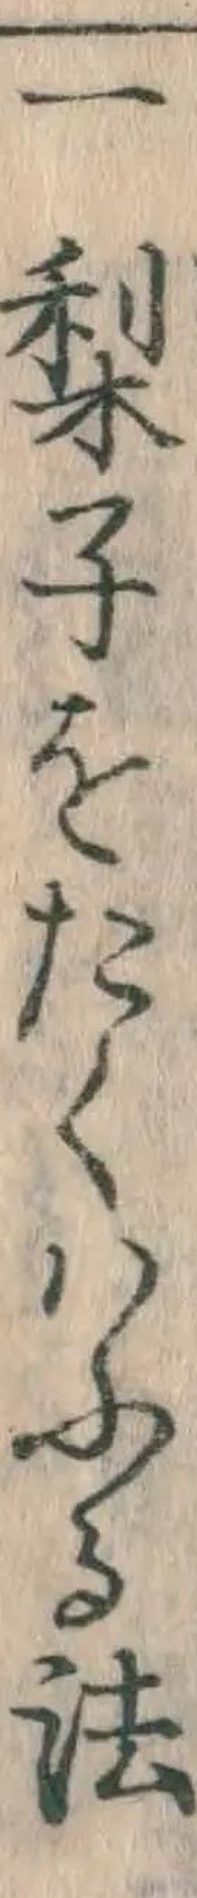一梨子をたくはふる法
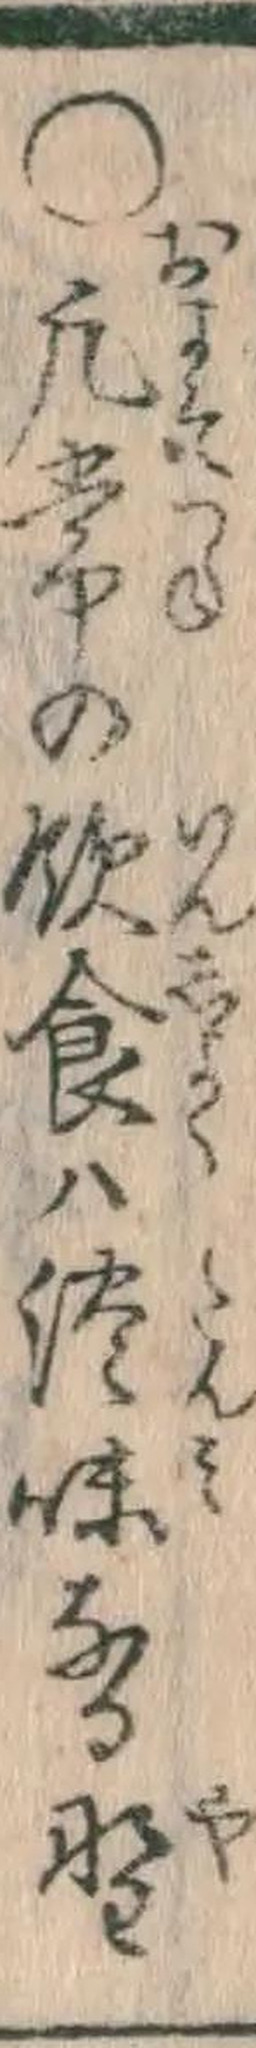○凡常の飲食は淡味なる野
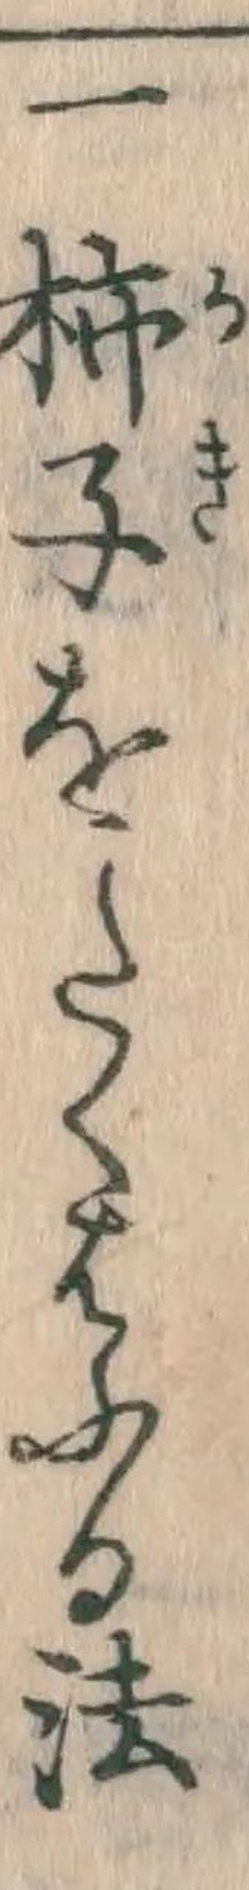一柿子をたくはふる法
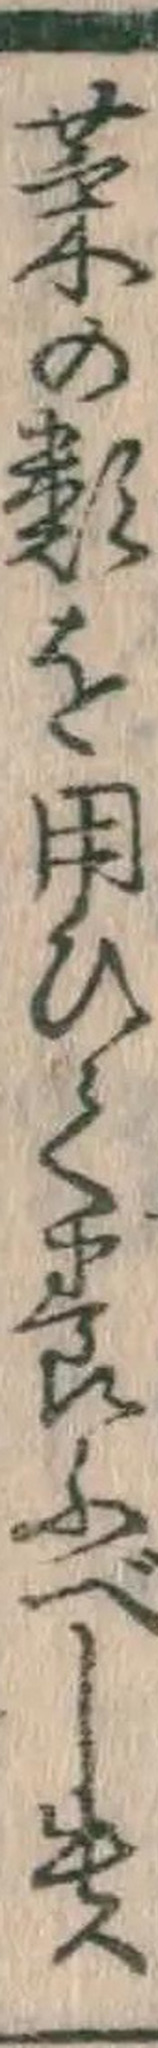菜の類を用ひて養ふべし貴
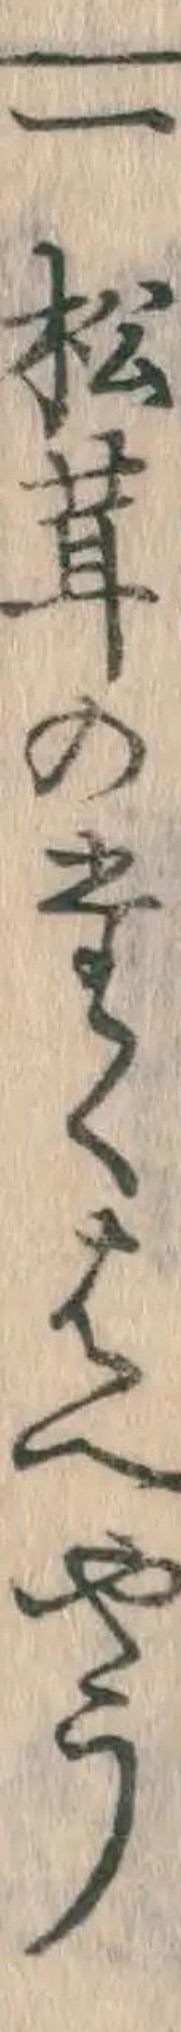一瓜のたくはへやう
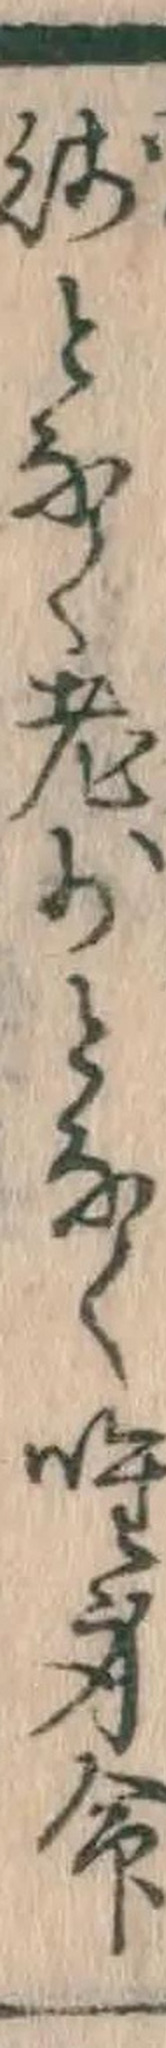賤となく老少となく唯身命
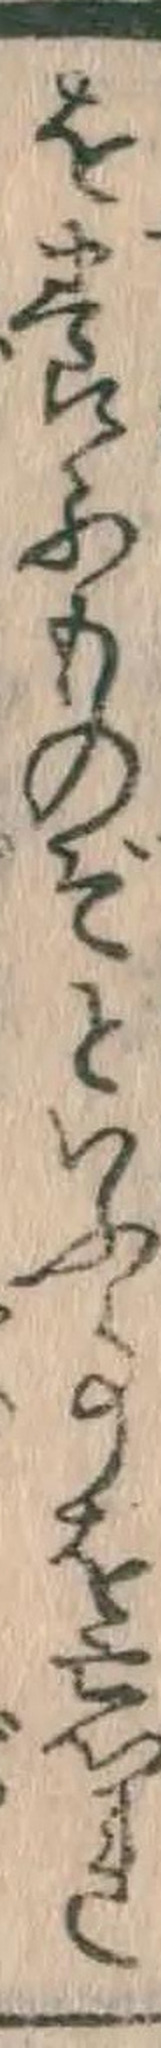を養ふものぞといふ事を忘れ
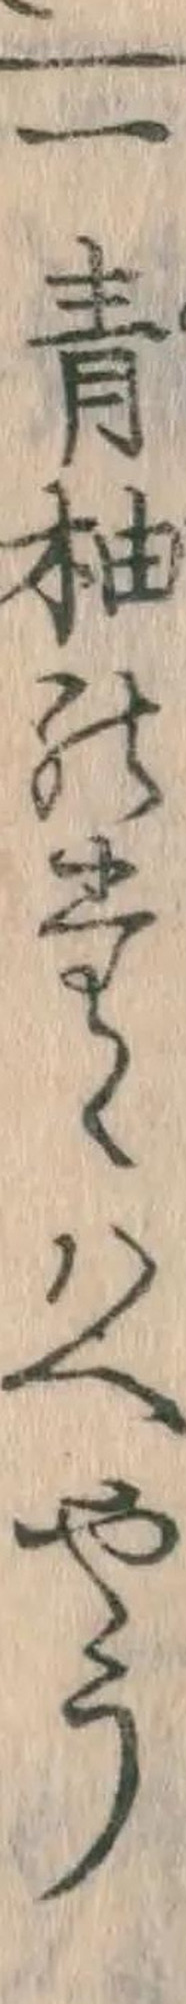一青柚のたくはへやう
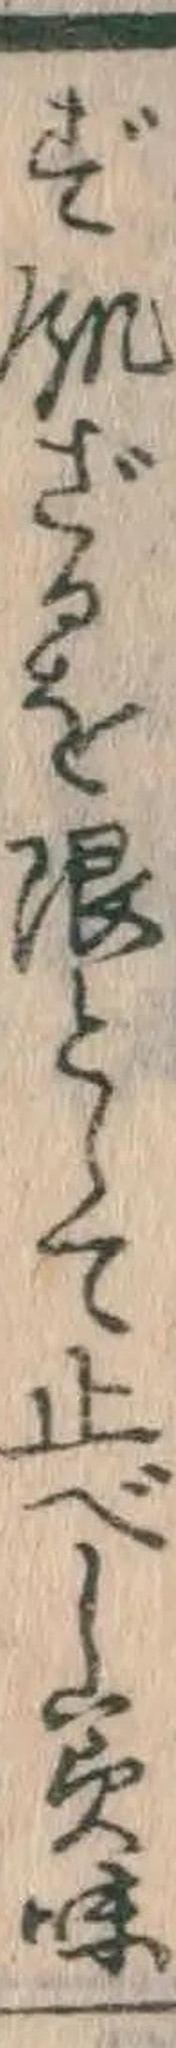ず飢ざるを限として止べし美味
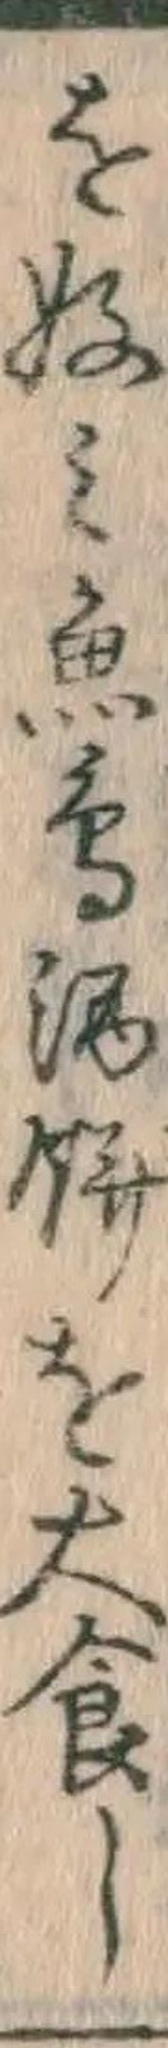を好み魚鳥酒餅を大食し
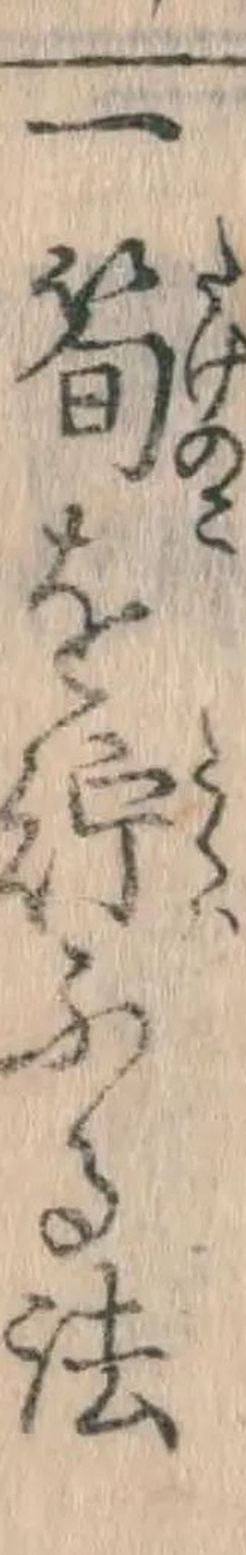一筍を貯ふる法
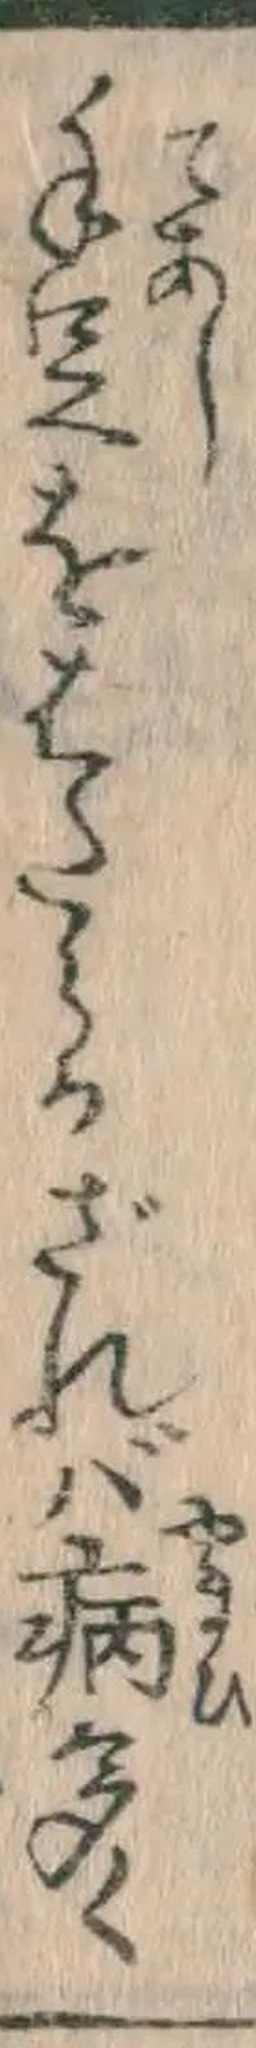手足をはたらかざれば病多く
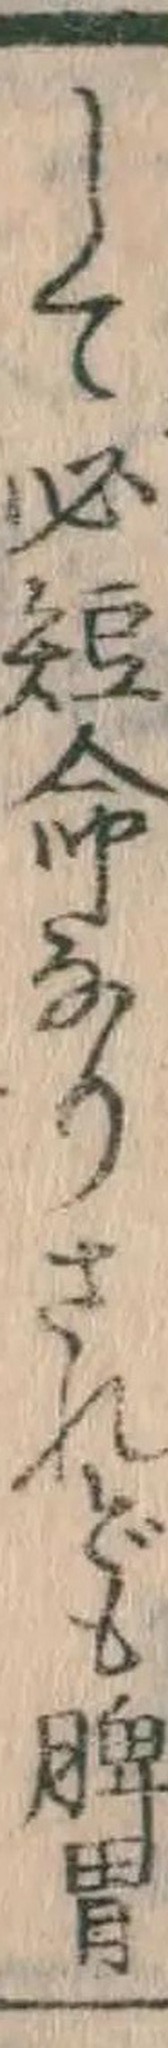して必短命なりされども脾胃
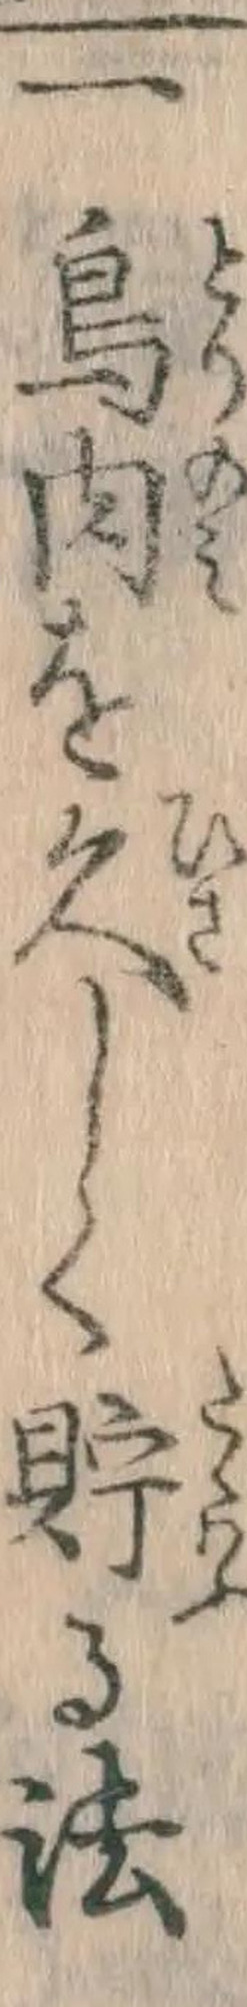一鳥肉を久しく貯る法
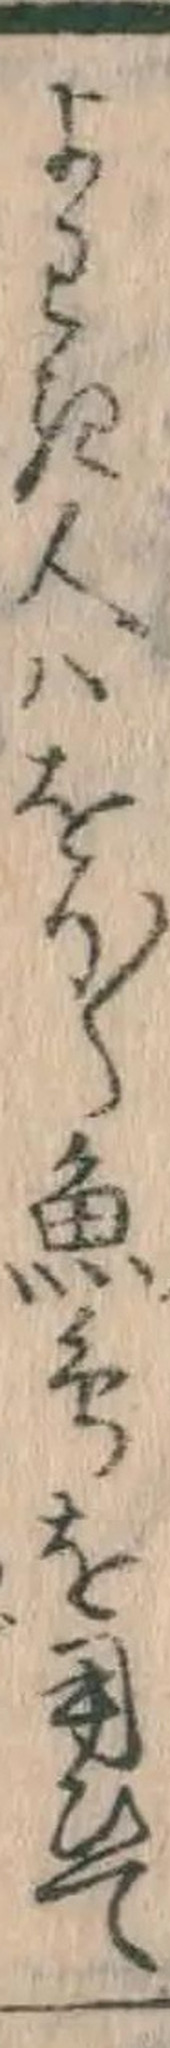よわき人はをり〳〵魚鳥を用ひて
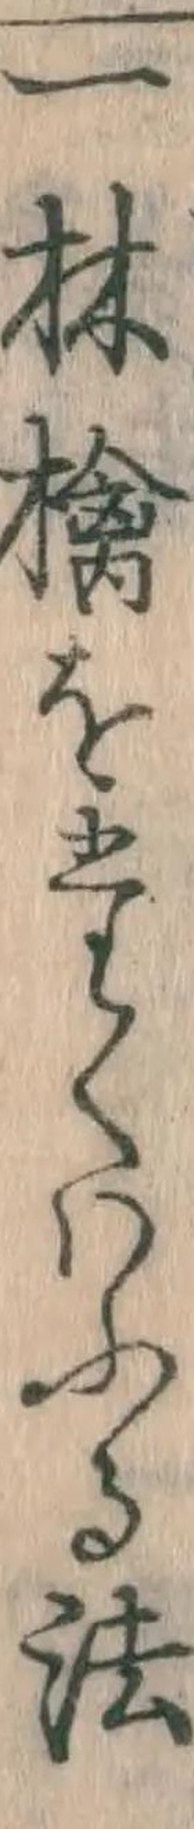一林檎をたくはふる法
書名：広益秘事大全 3巻. [1]
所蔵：国立国会図書館 National Diet Library, JAPAN
